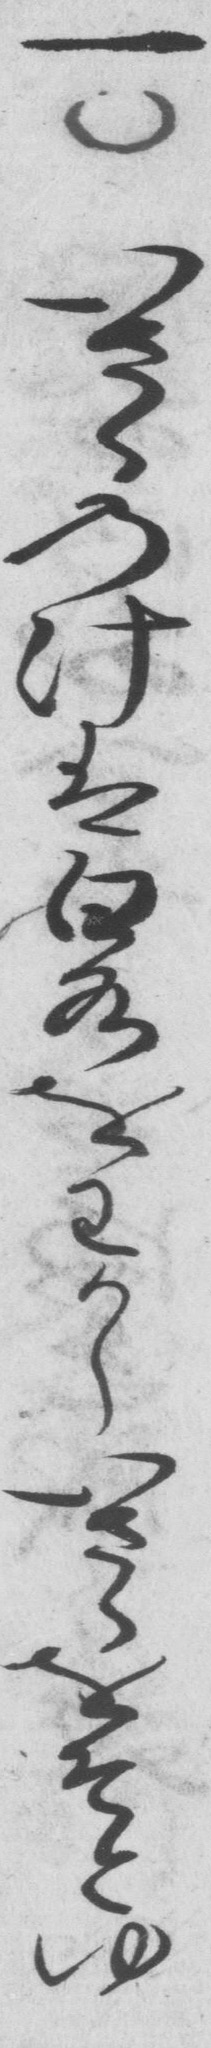一○いさらの汁は白水をわかしいさらをそとゆ
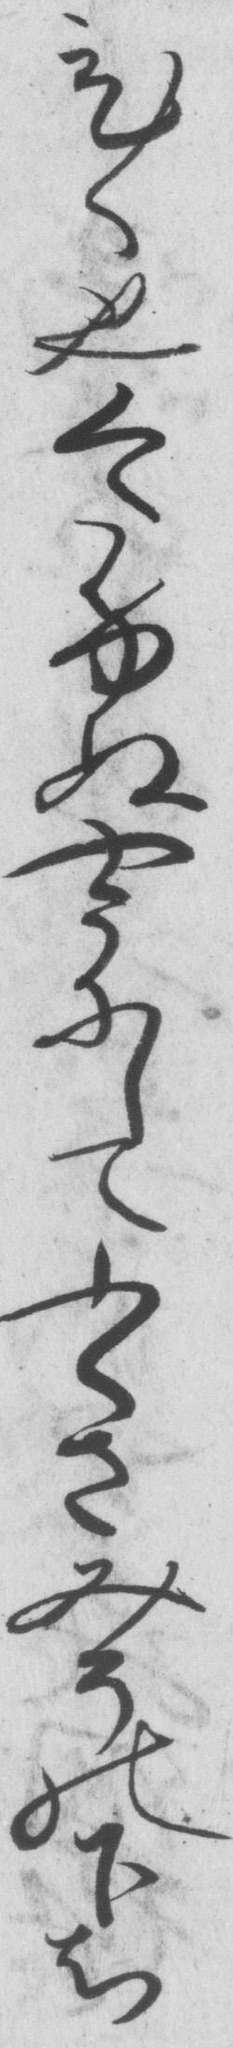ひく也くたけぬやうにしてふきみその下ち
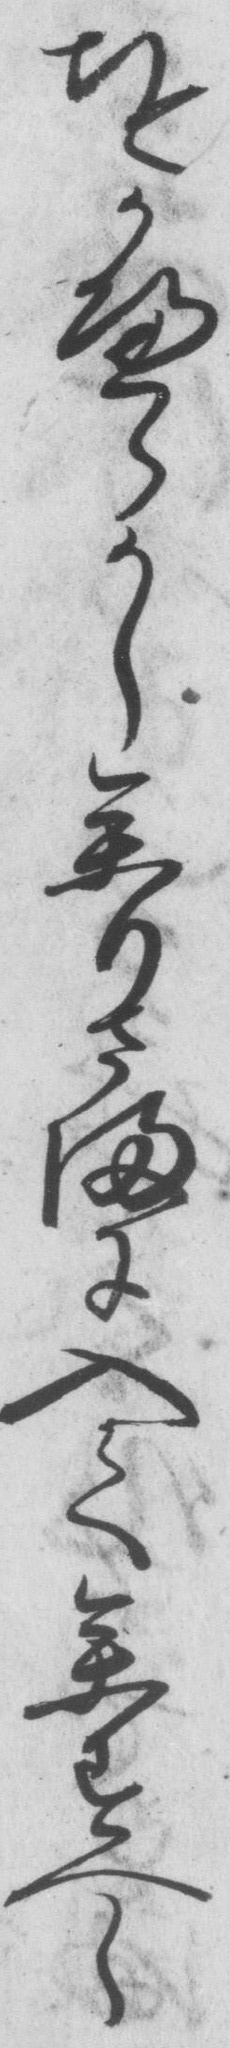をかへらかし参りさまに入て参すへし
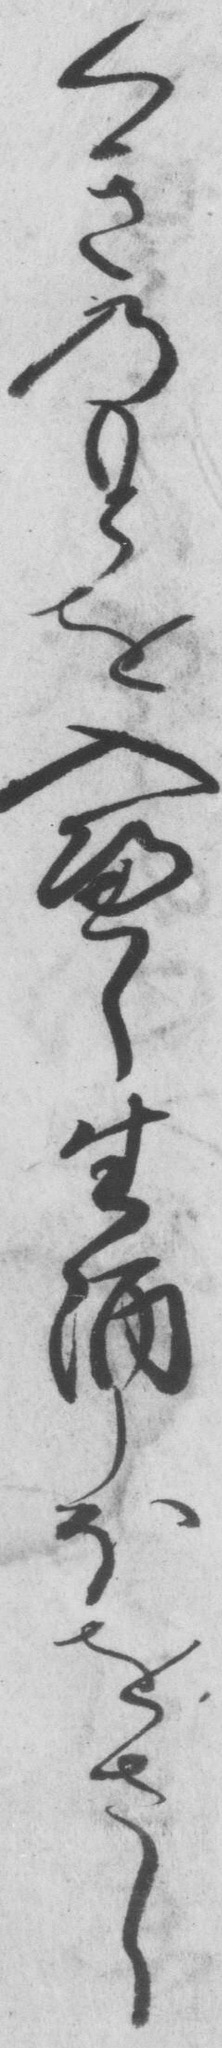くきのもちを入へし生酒しほをさし

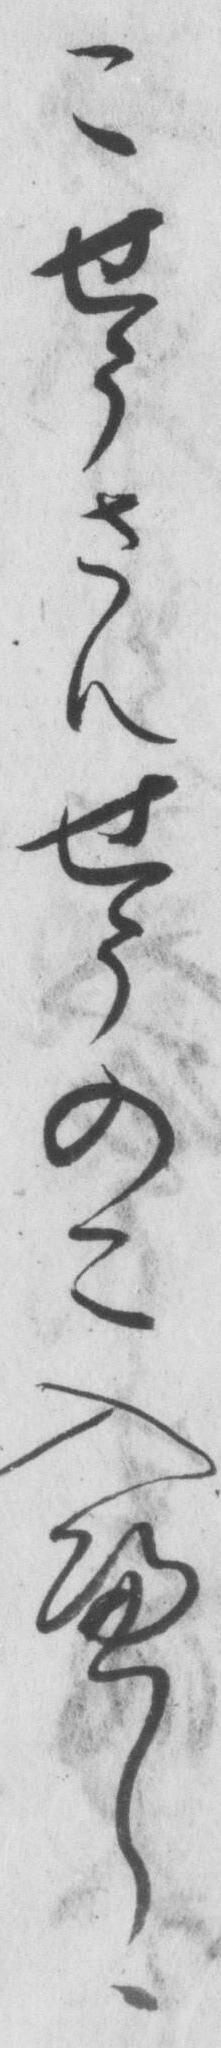こせうさんせうのこ入へし
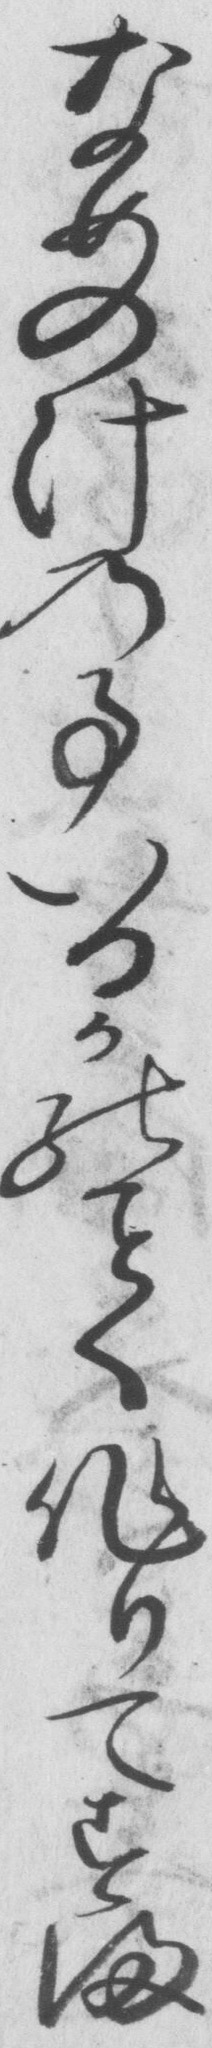一○なめの汁の事いるかのことく作りてすま
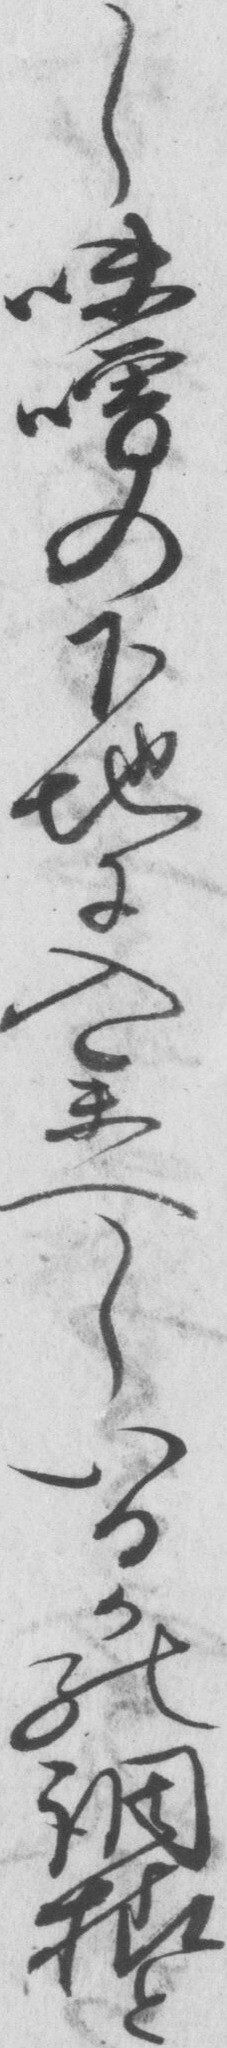し味噌の下地に入参へしいるかの調様と
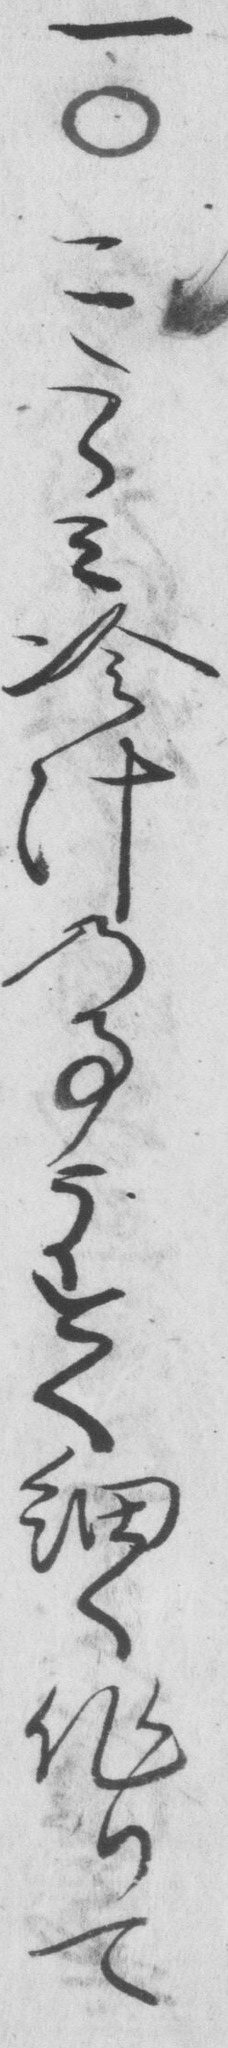一○こたゝみ冷汁の事うすく細く作りて
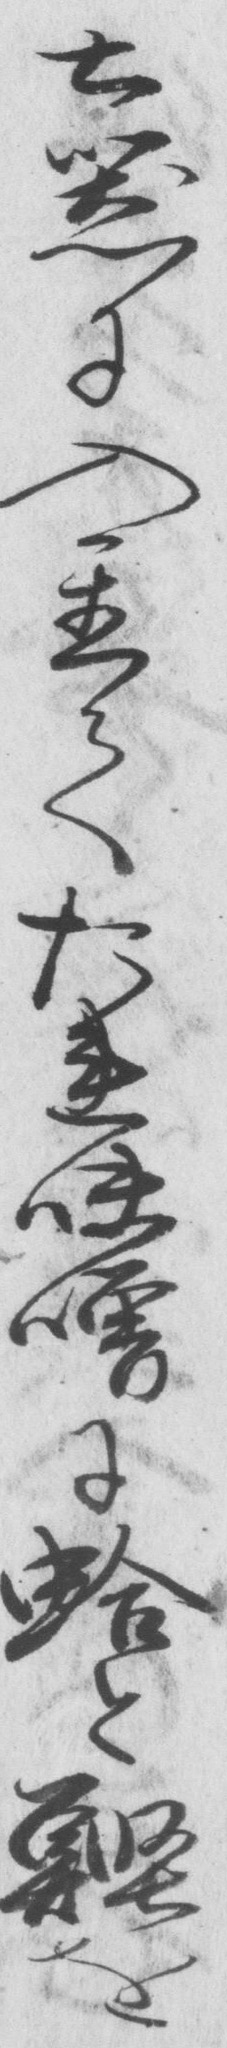土器に入置てたれ味噌に蛤と鰹を
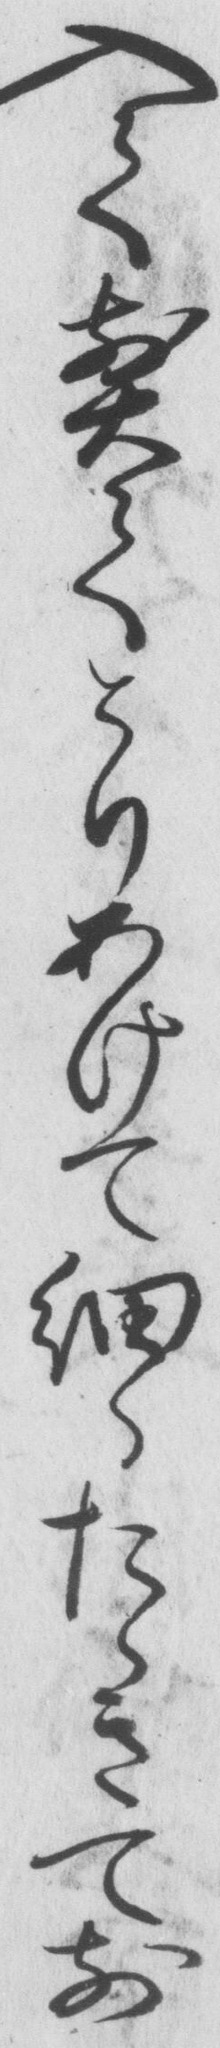入て煮てとりあけて細くたゝきて前
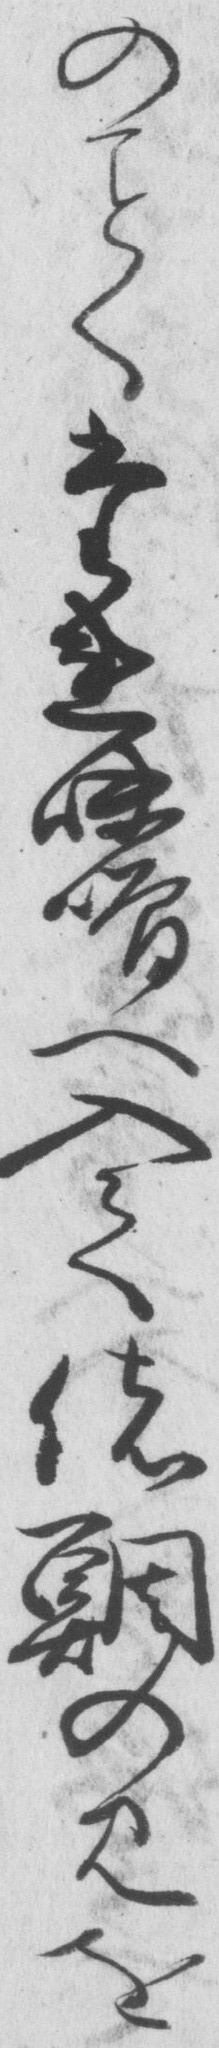ことくたれ味噌へ入て偖鯛のみを
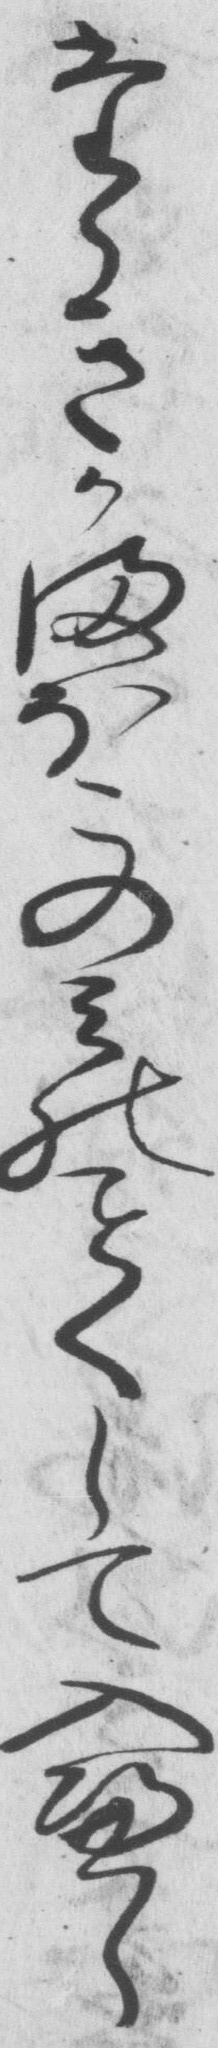たゝきかまほこのみのことくして入へし
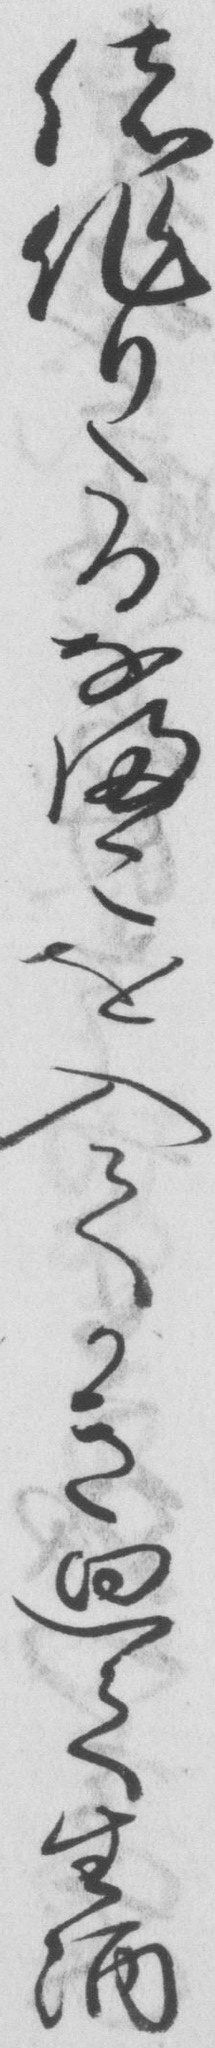偖作りたるなまこを入てかき廻て生酒
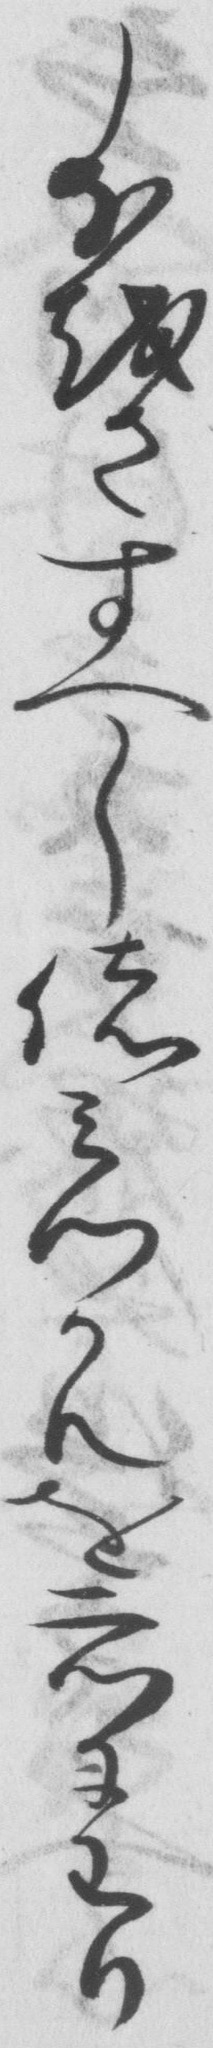しほ残さすへし偖みつかんを二つにわり
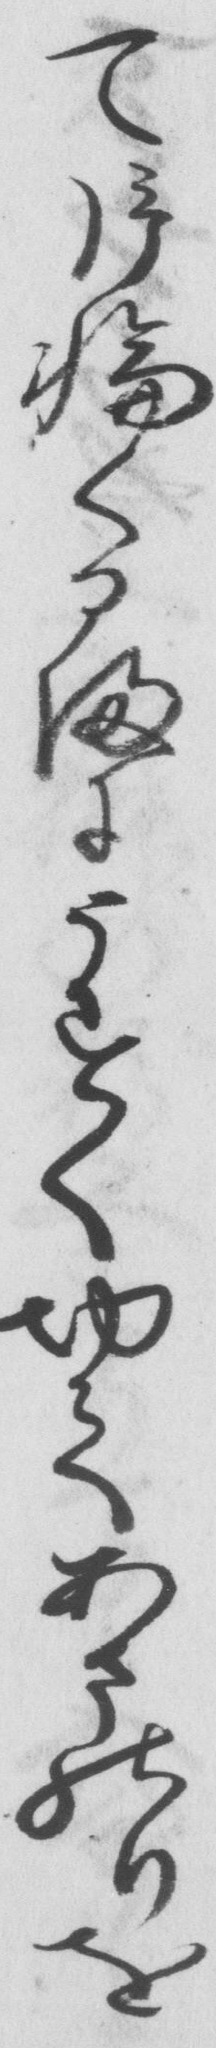て片輪くるまにうすく切てあさのりを
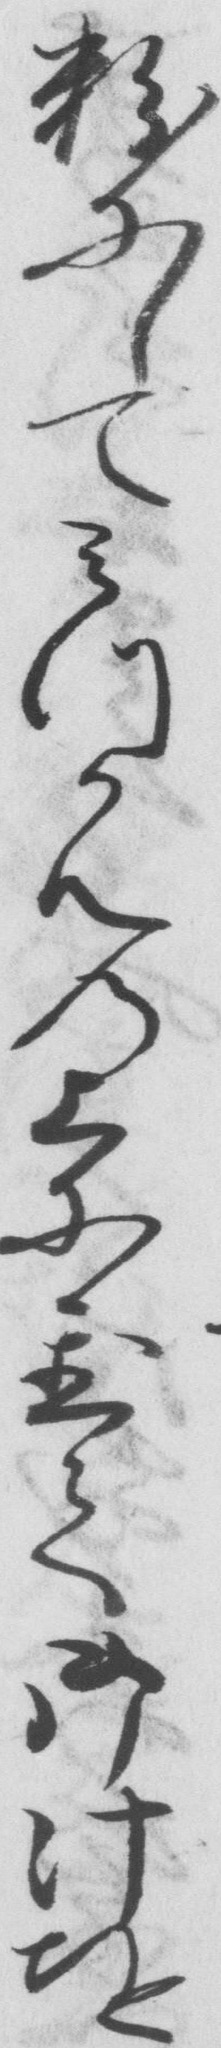粉にしてみつかんの上に置て御汁を
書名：料理次第
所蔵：大阪府立大学学術情報センター 国文学研究資料館
